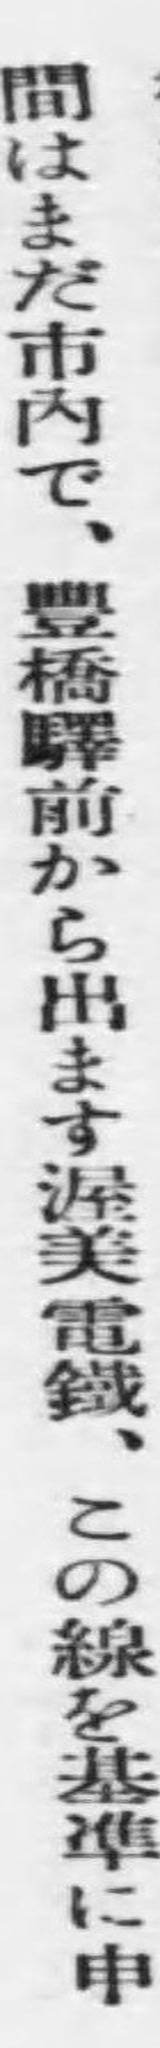間はまだ市内で、豊橋駅前から出ます渥美電鉄、この線を基準に申
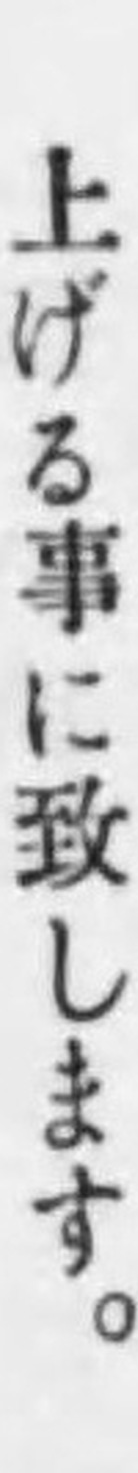上げる事に致します。
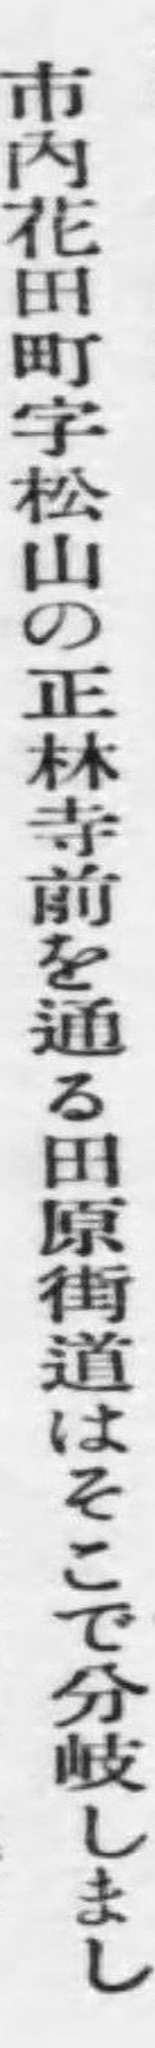市内花田町字松山の正林寺前を通る田原街道はそこで分岐しまし
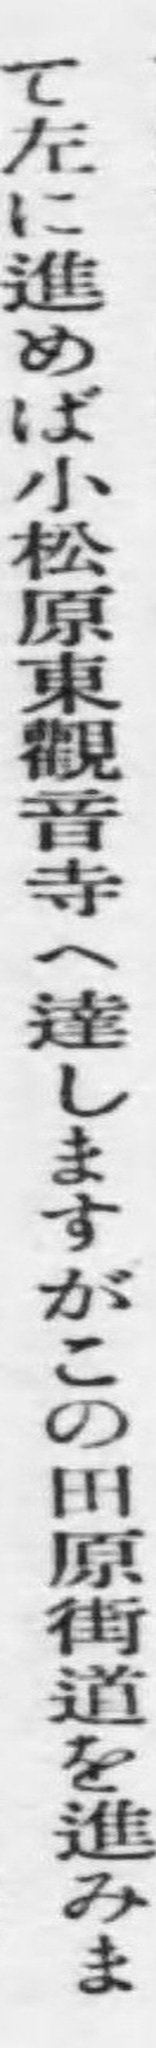て左に進めば小松原東観音寺へ達しますがこの田原街道を進みま
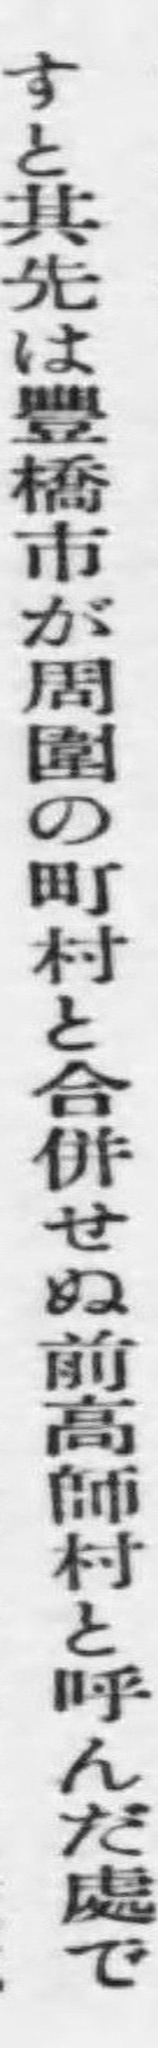すと其先は豊橋市が周囲の町村と合併せぬ前高師村と呼んだ処で
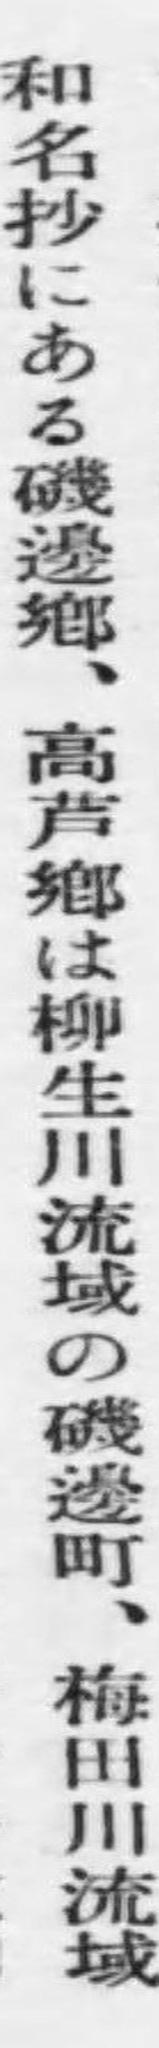和名抄にある磯辺郷、高芦郷は柳生川流域の磯辺町、梅田川流域
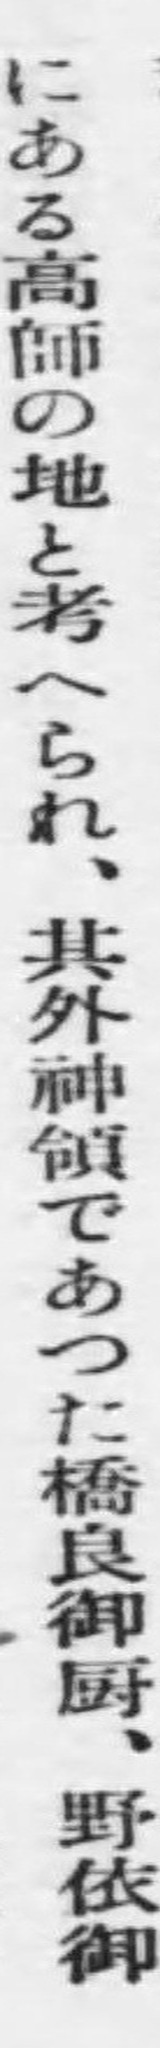にある高師の地と考へられ、其外神領であつた橋良御厨、野依御
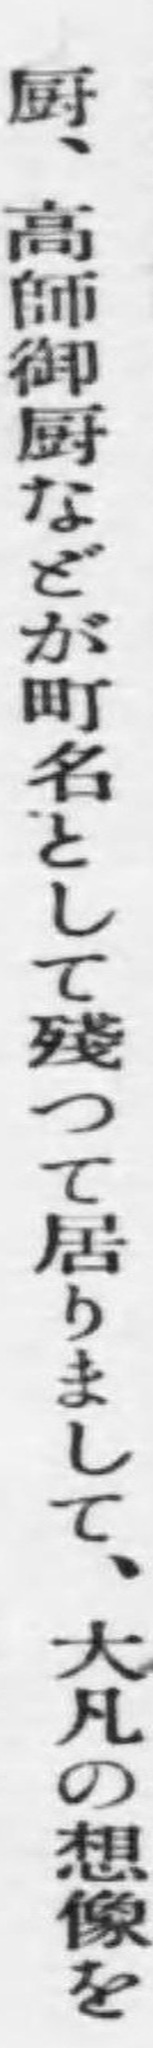厨、高師御厨などが町名として残つて居りまして、大凡の想像を
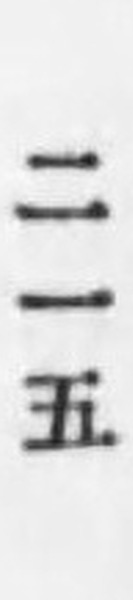二一五

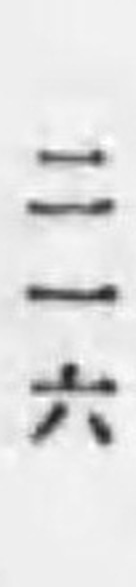二一六
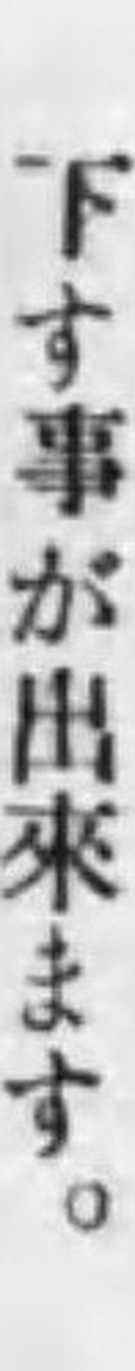下す事が出来ます。
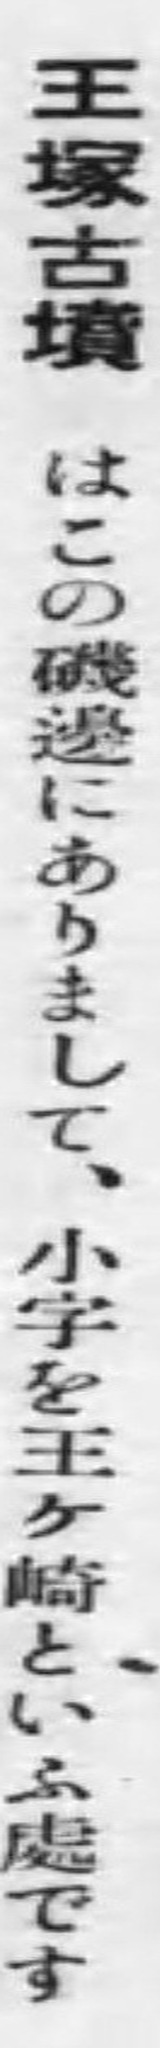王塚古墳はこの磯辺にありまして、小字を王ヶ崎といふ処です
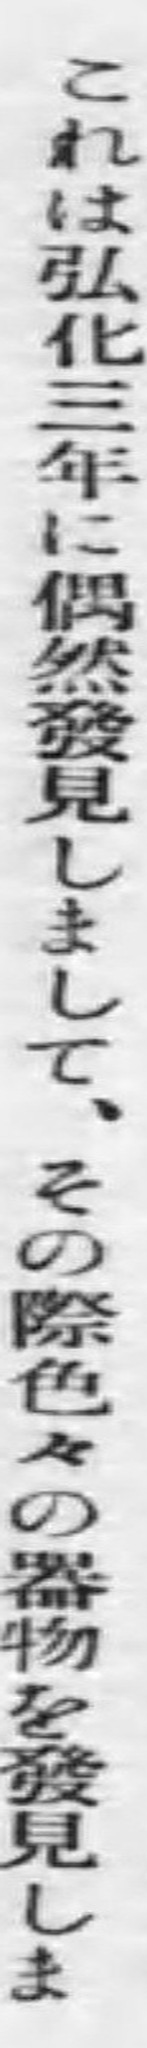これは弘化三年に偶然発見しまして、その際色々の器物を発見しま
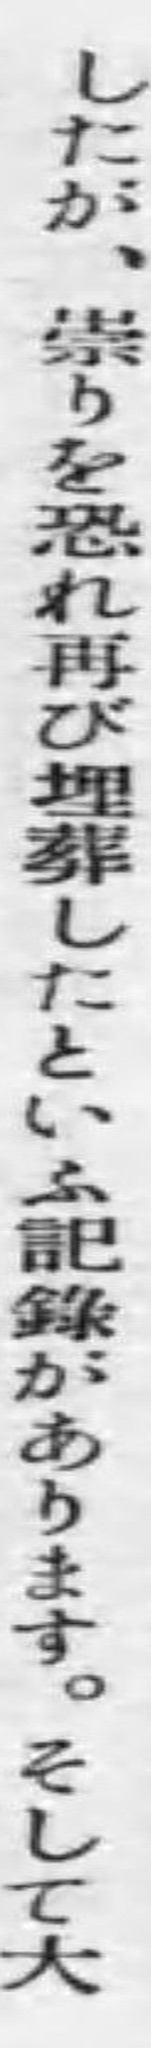したが、崇りを恐れ再び埋葬したといふ記録があります。そして大
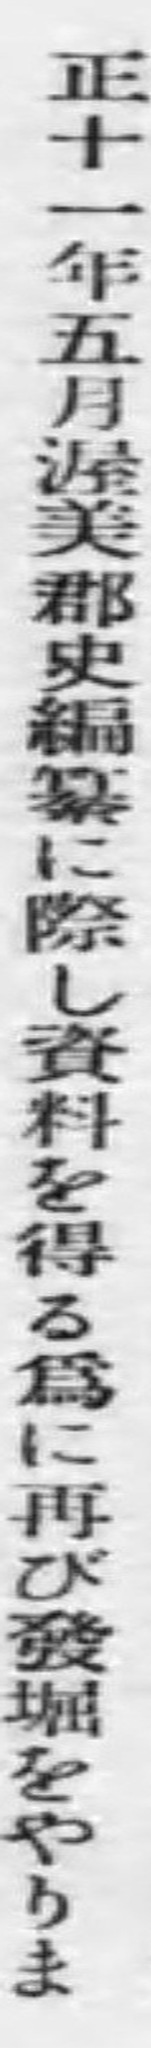正十一年五月渥美郡史編纂に際し資料を得る為に再び発堀をやりま
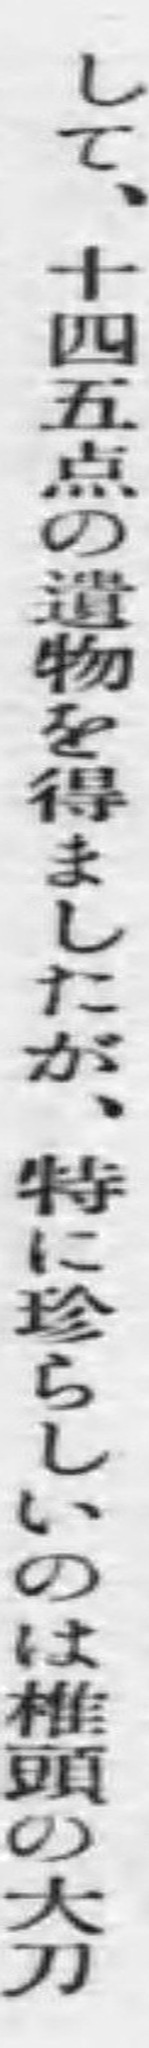して、十四五点の遺物を得ましたが、特に珍らしいのは椎頭の大刀
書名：東三河道中記 : 豊橋市及其附近案内
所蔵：国立国会図書館 National Diet Library, JAPAN
